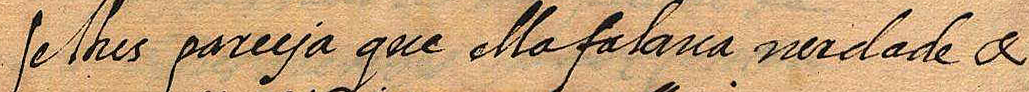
se lhes parecja que ella falaua uerdade &
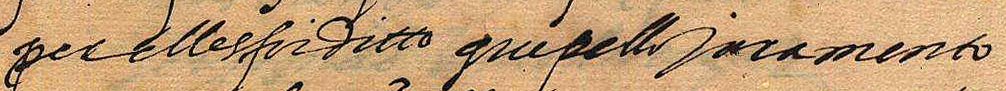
por elles foi ditto que pello juramento
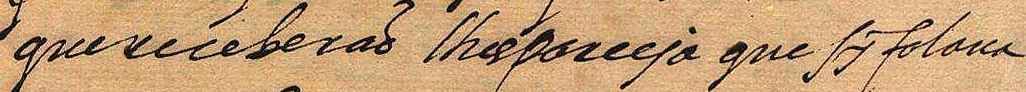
que receberaõ lhes parecja que sy falaua
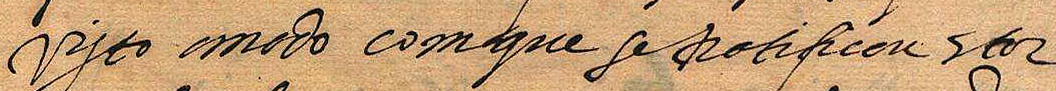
visto o modo com que se Ratificou E tor
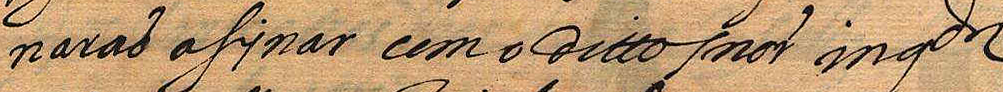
naraõ asynar com o ditto snor̄ inqdor
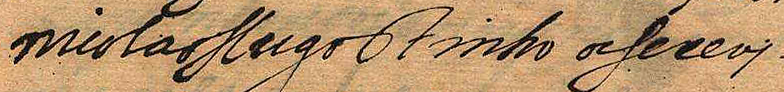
nicolao Augostinho o escreuj
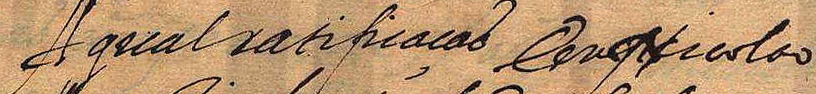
A qual ratificaçaõ E eu Nicolao
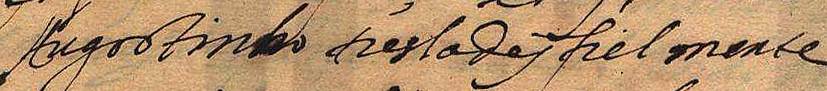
Augostinho tresladej fielmente
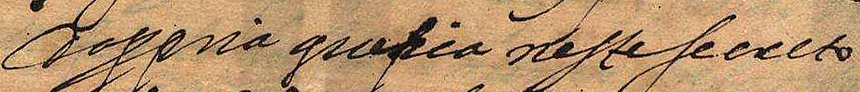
da ꝓpria que fica neste secreto
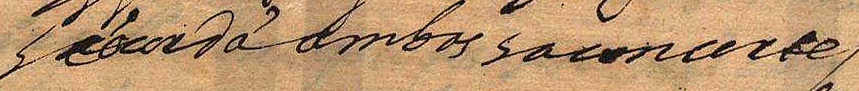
E o acordā ambos E a concertej
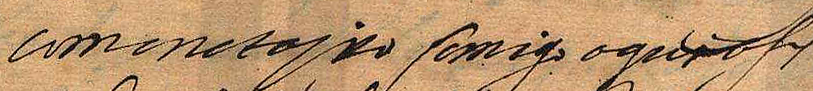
com o notajro Comigo o que asy
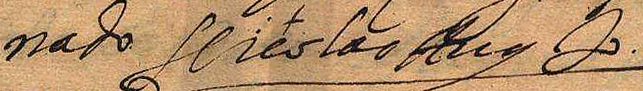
nado Nicolao Augto
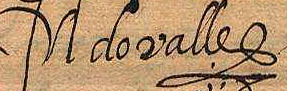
Mel do valle
